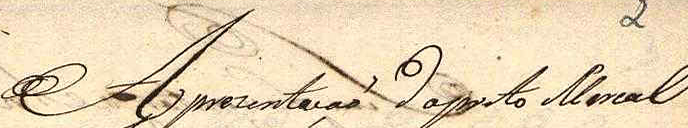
Aprezentaçaõ do preto Marcal
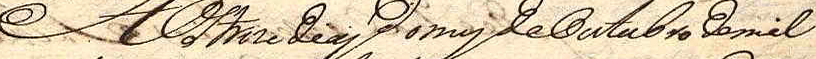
AOs treze dias do mes de Outubro de mil
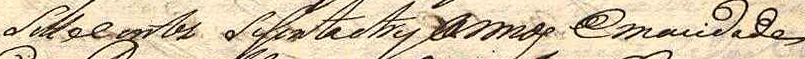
settecentos sesenta e tres annos em a cidade
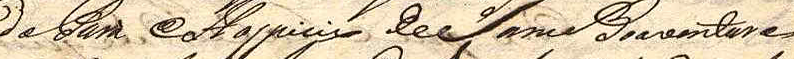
do Para e Hospicio de Sam Boaventura
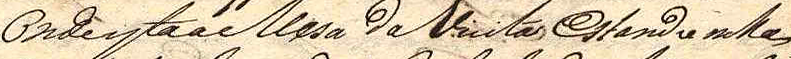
Onde esta a Mesa da Visita Estando nella
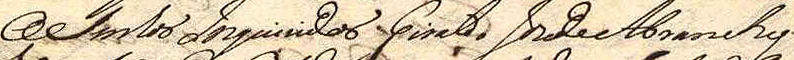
O Senhor Inquisidor Giraldo Joze de Abranches
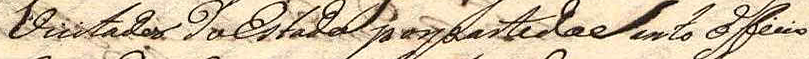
Visitador do Estado por parte do Santo officio
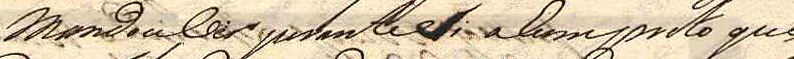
Mandou Uir perante Si a hum preto que
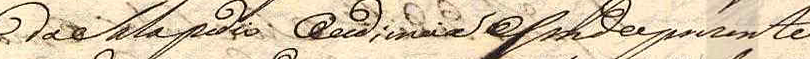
da Sala pedio audiencia asim do prezente
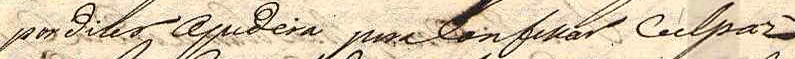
por dizer o pedira para confessar culpaz
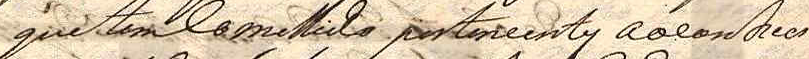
que tem Comettido pertencentes ao conheci
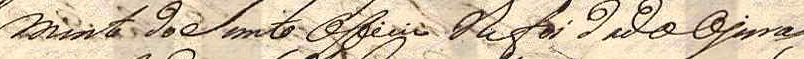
mento do Santo Officio lhe foi dado o jura
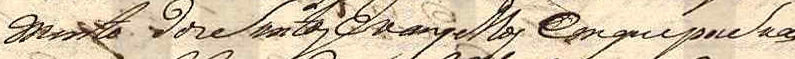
mento doz Santos Evangelhos em que pos sua
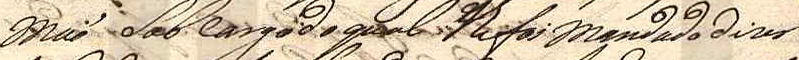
maõ sob cargo do qual lhe foi mandado dizer
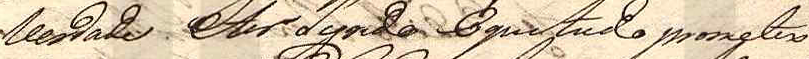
verdade e ter segredo o que tudo prometeo
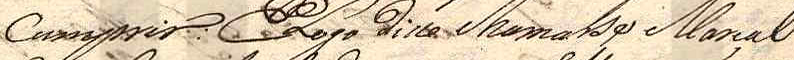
Cumprir E Logo disse chamarse Marçal
